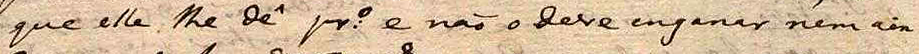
que elle lhe dé pr.o e naõ o deve enganar nem ain
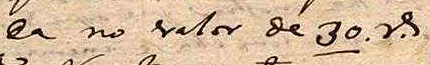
da no valor de 30. rs.
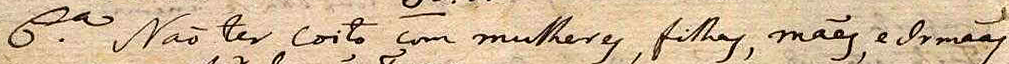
6.a Naõ ter coito com mulheres. filhas, maẽs, e Irmaãs
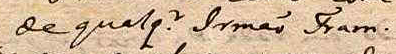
de qualq.r Irmaõ Fram.
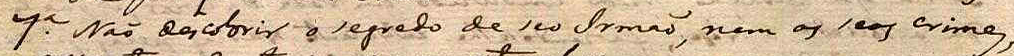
7.a Naõ descobrir o segredo de seo Irmaõ, nem os seos crimes,
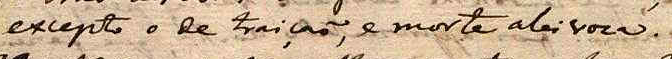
excepto o de traiçaõ, e morte aleivoza.
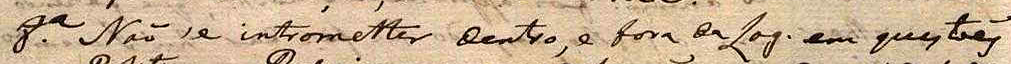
8.a Naõ se intrometter dentro, e fora da Log. em questoẽs
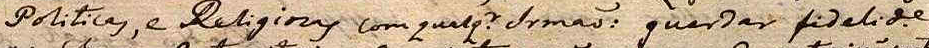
Politicas, e Religiozas com quelq.r Irmaõ: guardar fidelid.e
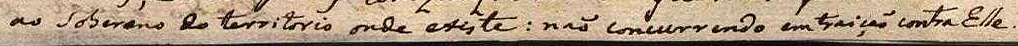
ao soberano do territorio onde existe: naõ concurrendo em traiçaõ contra Elle.
